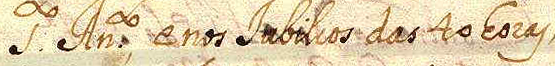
s.to An.to, e nos Iubileos das 40 horas,
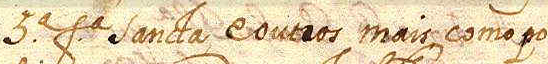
5.a f.a sancta, e outras mais como po
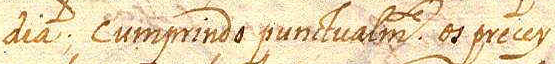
dia; cumprindo punctualm.te os precey
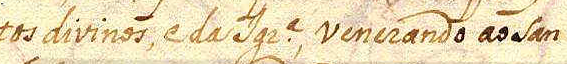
tos divinos, e da Igr.a, venerando ao san
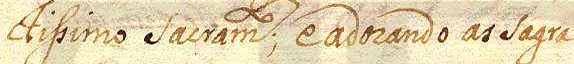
ctissimo sacram.to e adorando as sagra
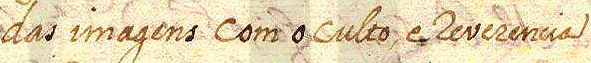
das imagens com o culto, e Reverencia
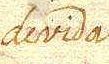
devida.
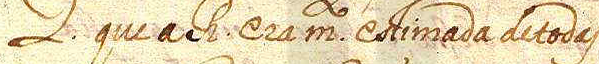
P. que a R. era m.to estimada de todas
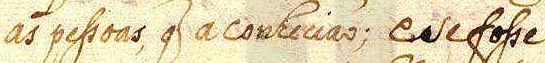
as pessoas, q̄ a conheciaõ; e se fosse
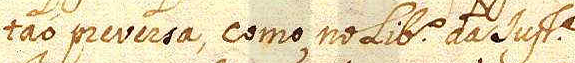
taõ preversa, como no Lib.o da Iust.a
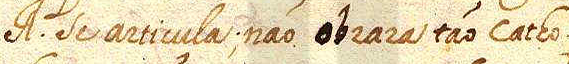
A. se articula; naõ obrara tão catho
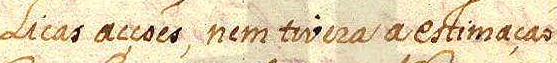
Licas acções, nem tivera a estimaçaõ
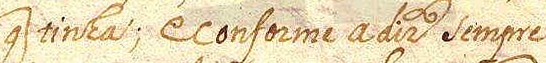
q̄ tinha; e conforme a dir.to sempre
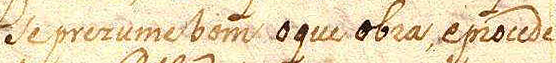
se prezume bom o que obra, e procede
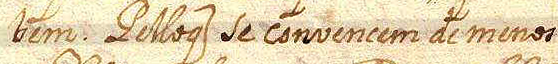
bem. Pello q̄ se convencem de menos
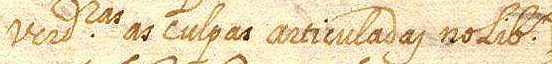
verd.ras as culpas articuladas no Lib.o
